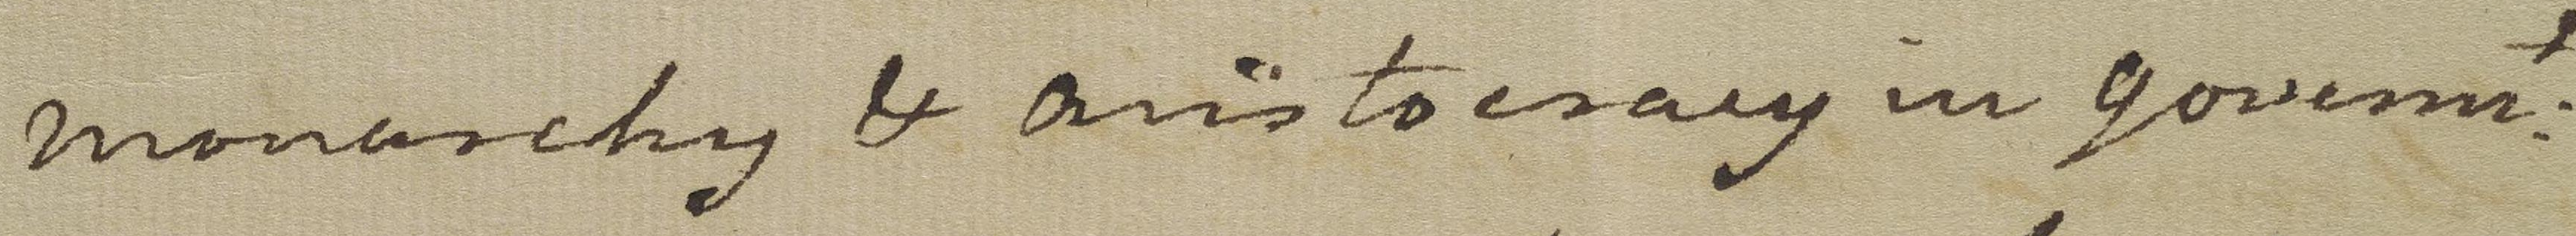monarchy & aristocracy in govern^t.
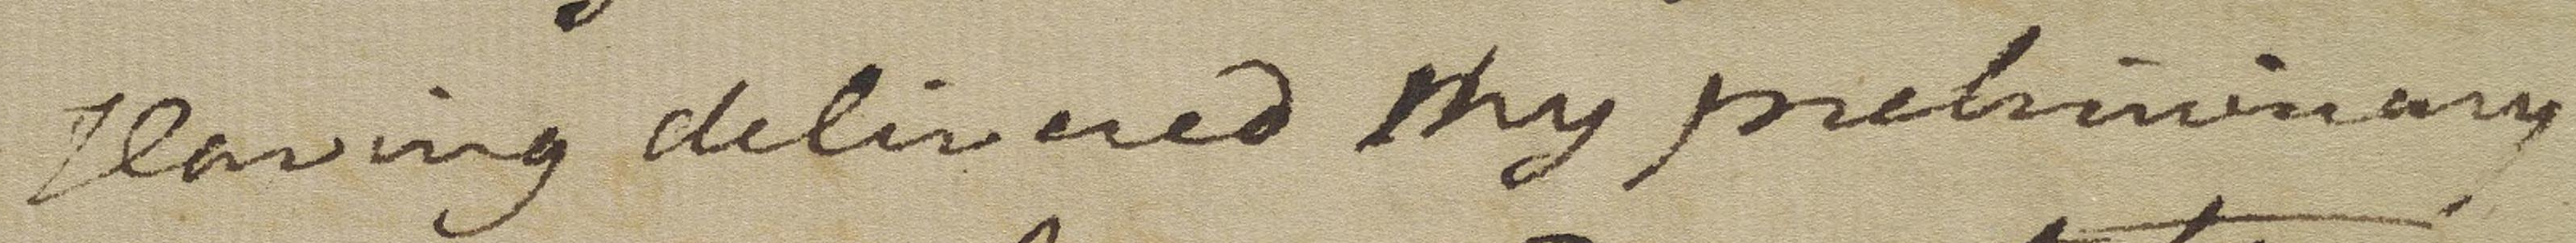Having delivered my preliminary
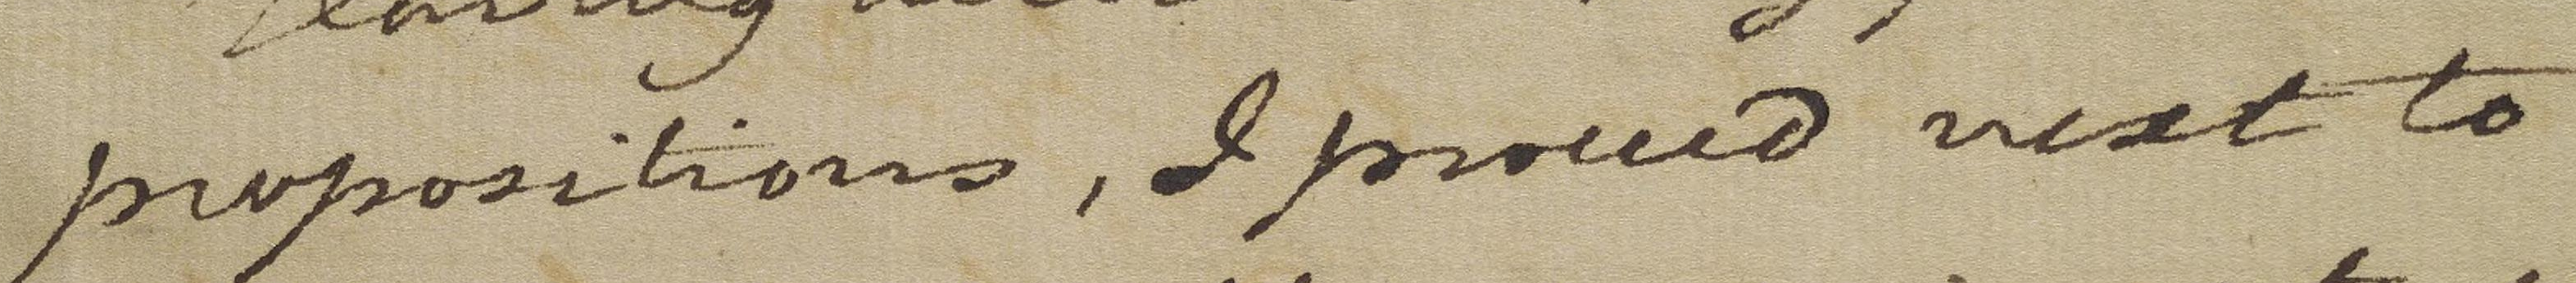propositions, I proceed next to
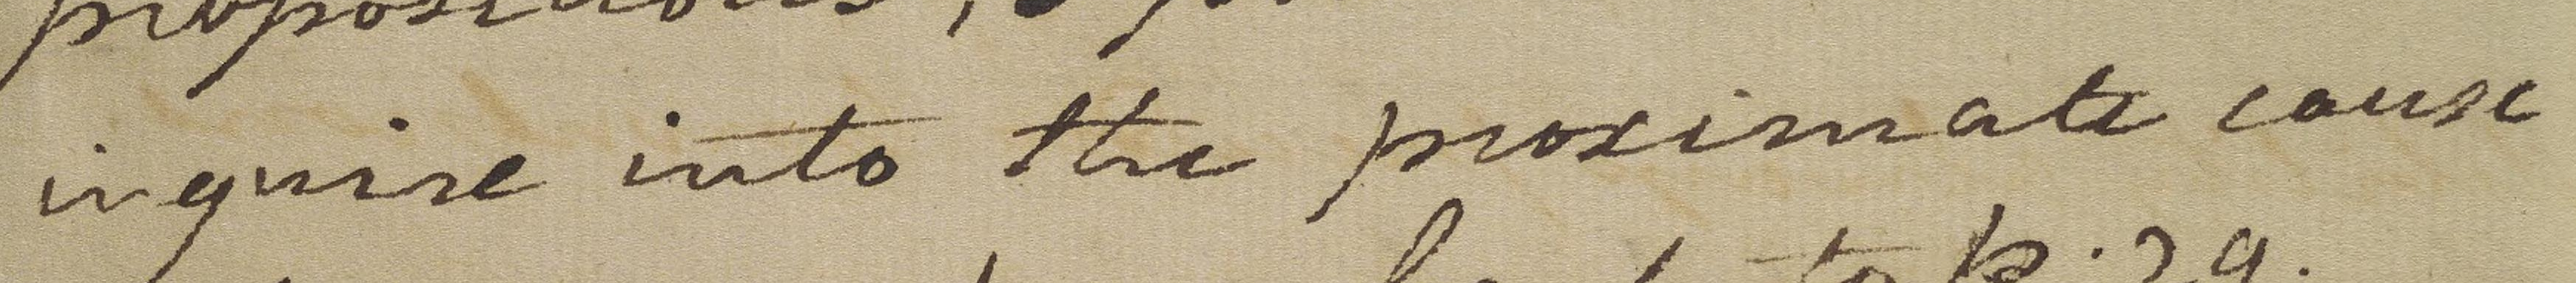inquire into the proximate cause
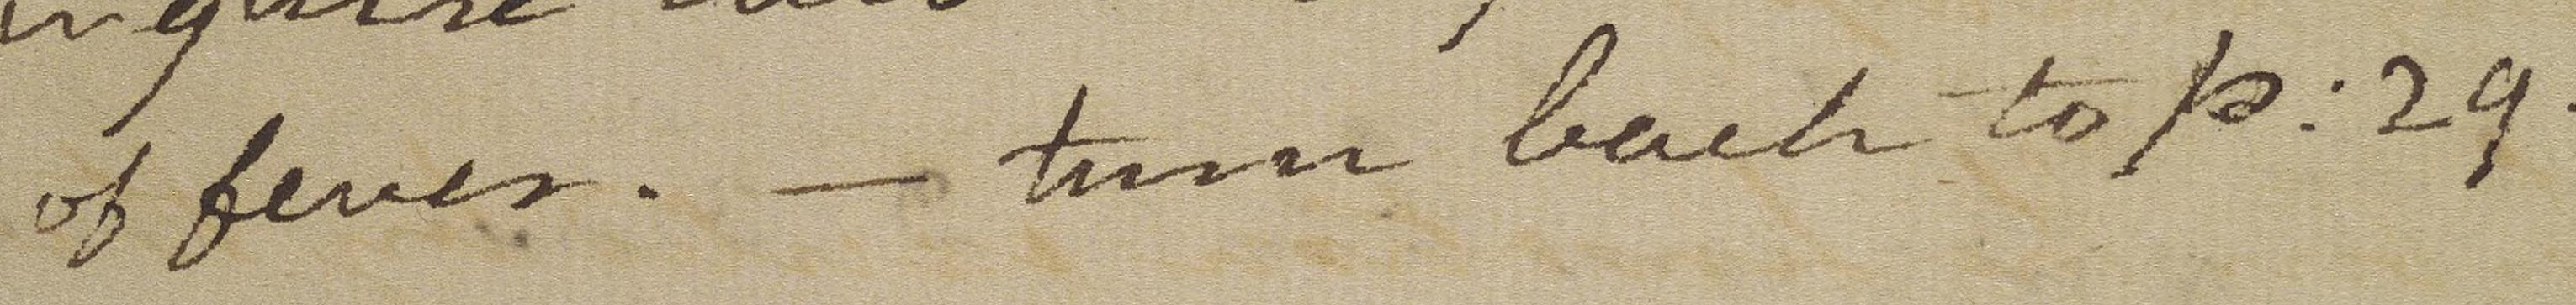of fever.- turn back to p. 29
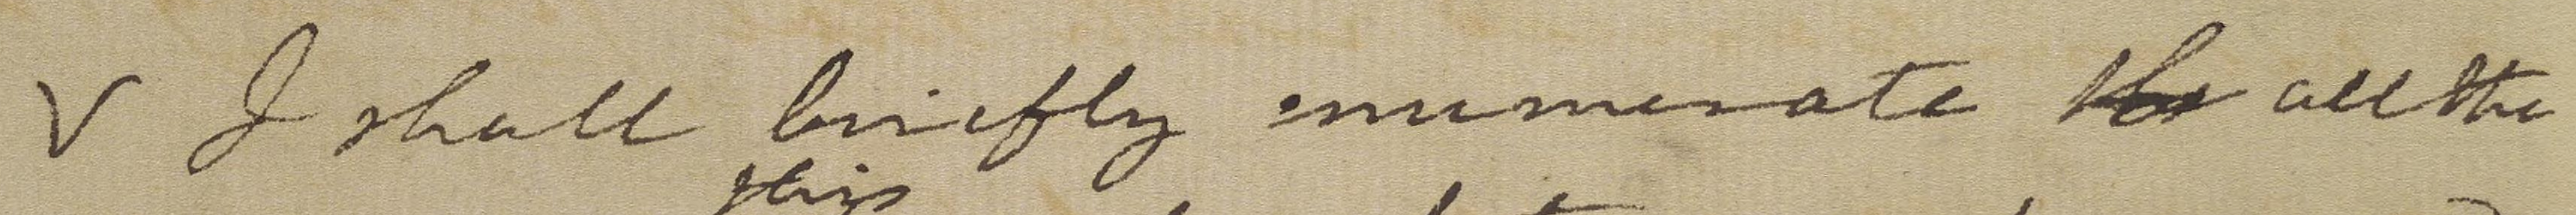V I shall briefly enumerate [the] all the
